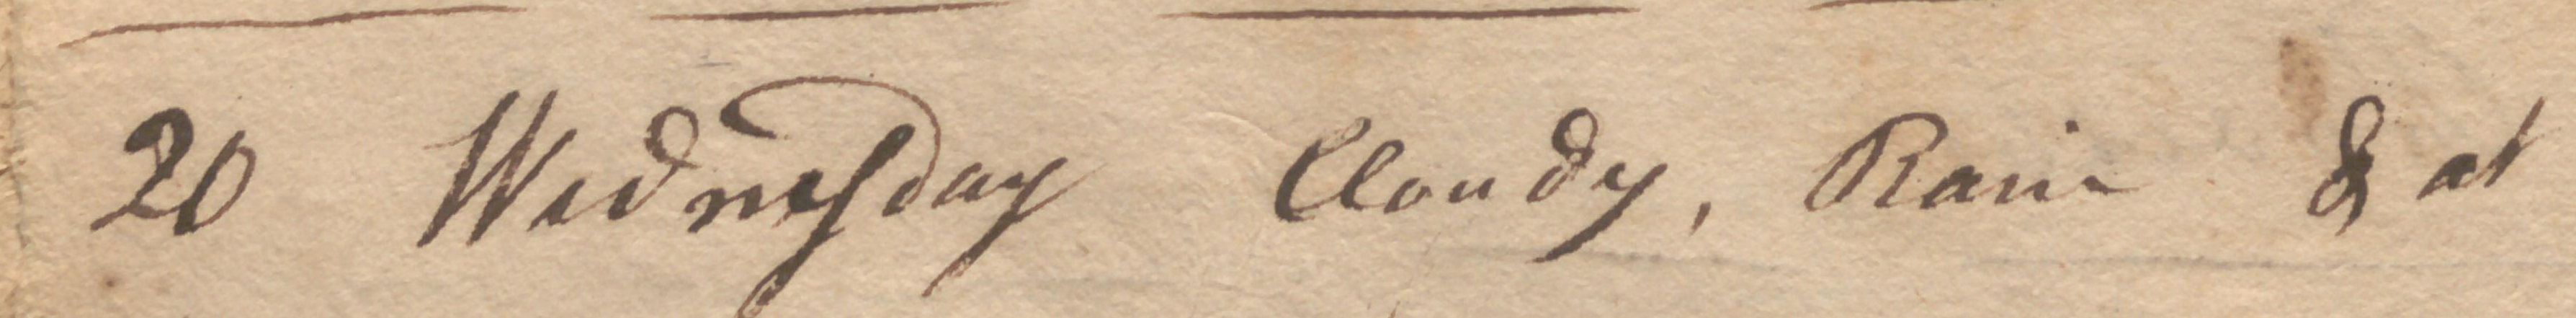20 Wednesday Cloudy, Rain & at
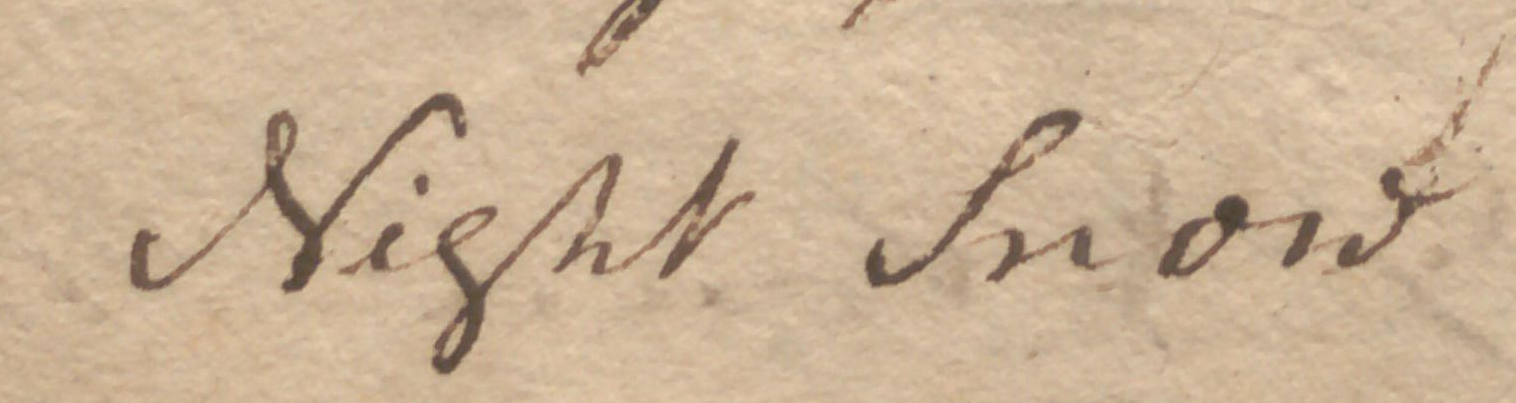Night Snow
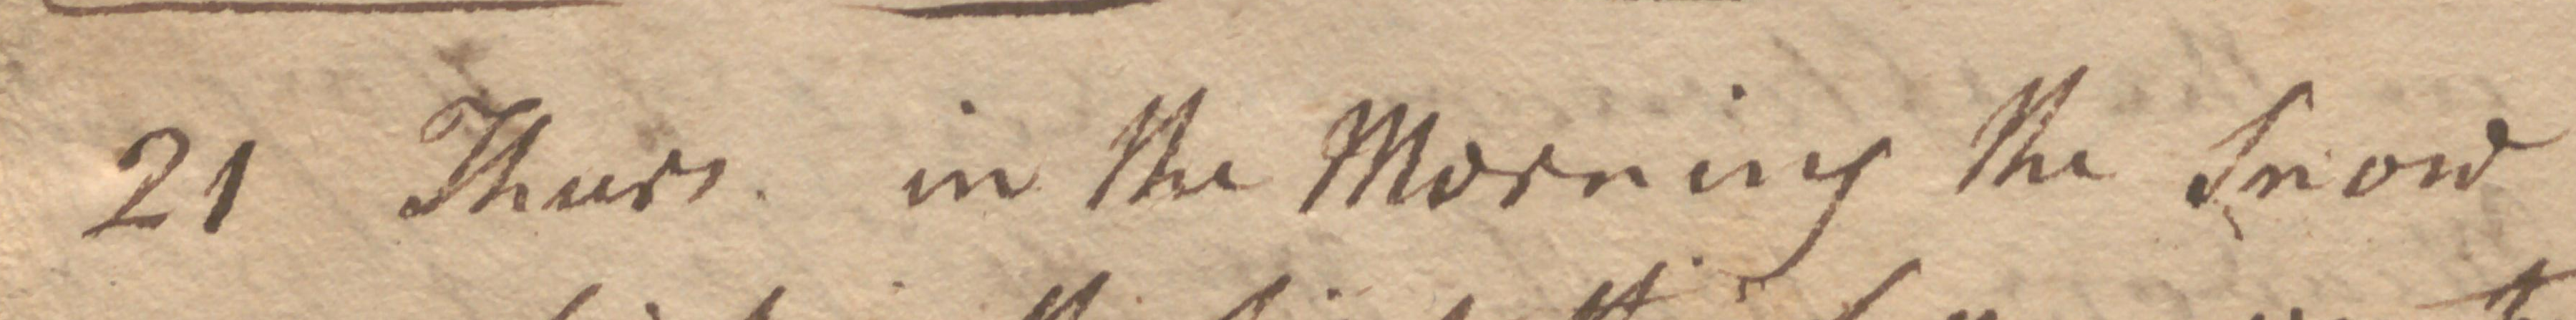21 Thurs. in the Morning the Snow
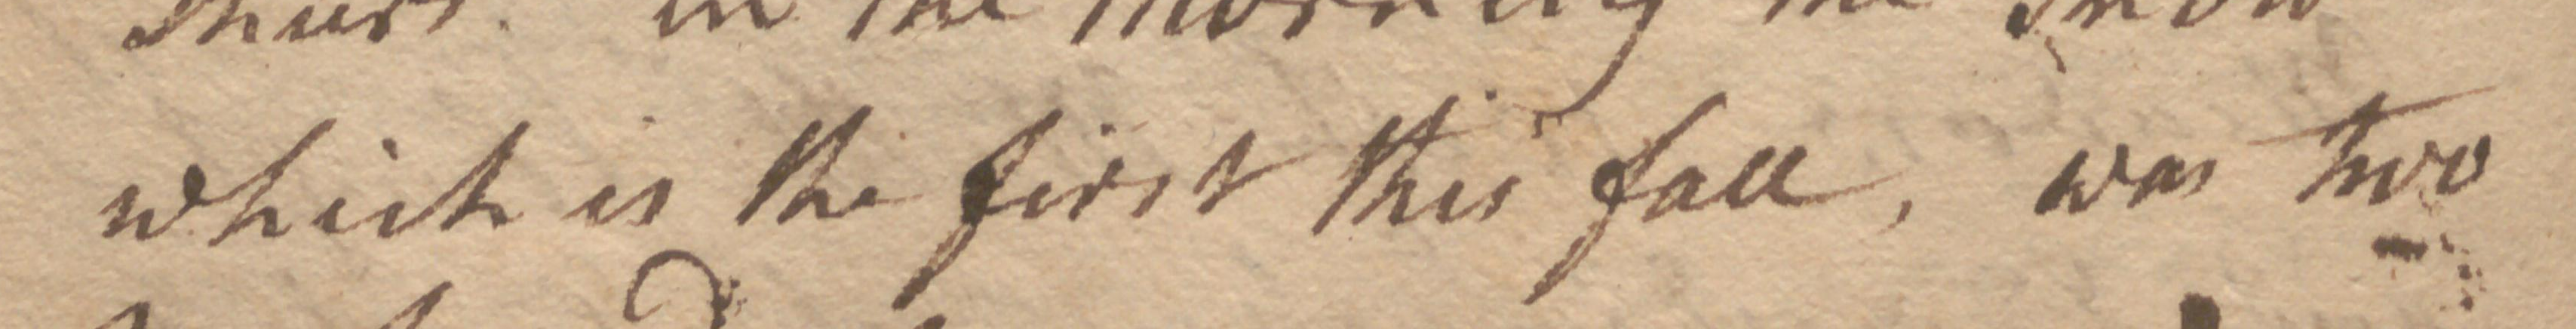which is the first this fall, was two
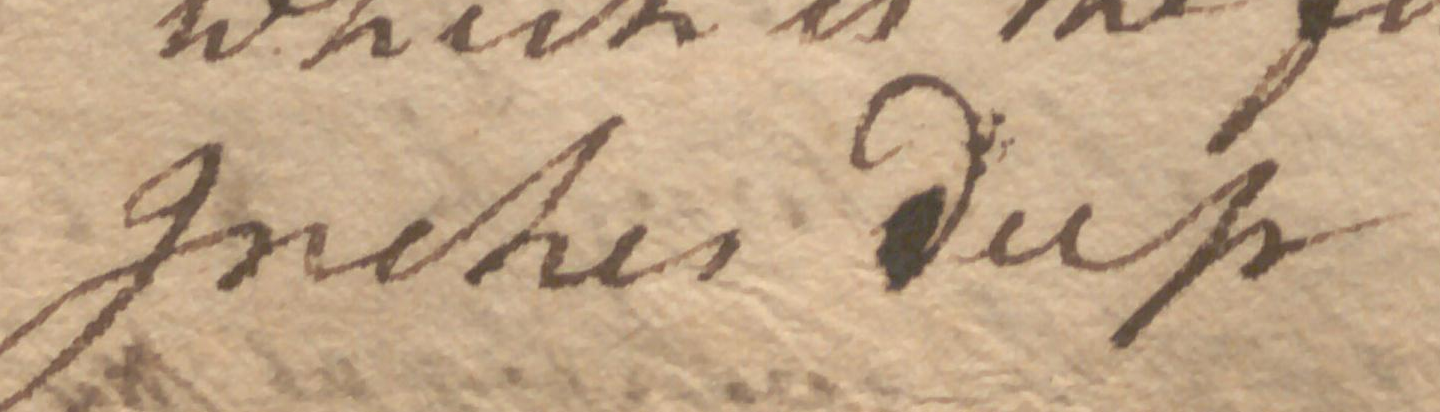Inches deep
